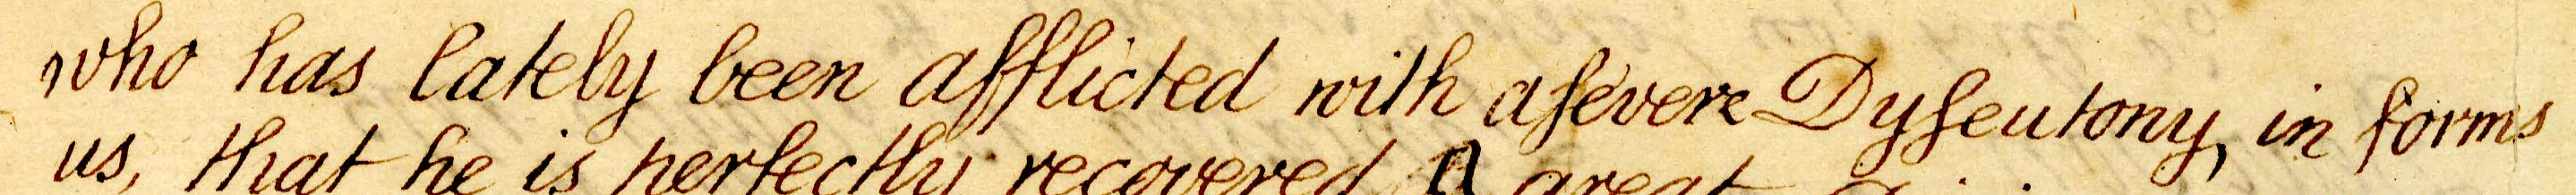who has lately been Afflicted with a severe Dyseutony, in forms
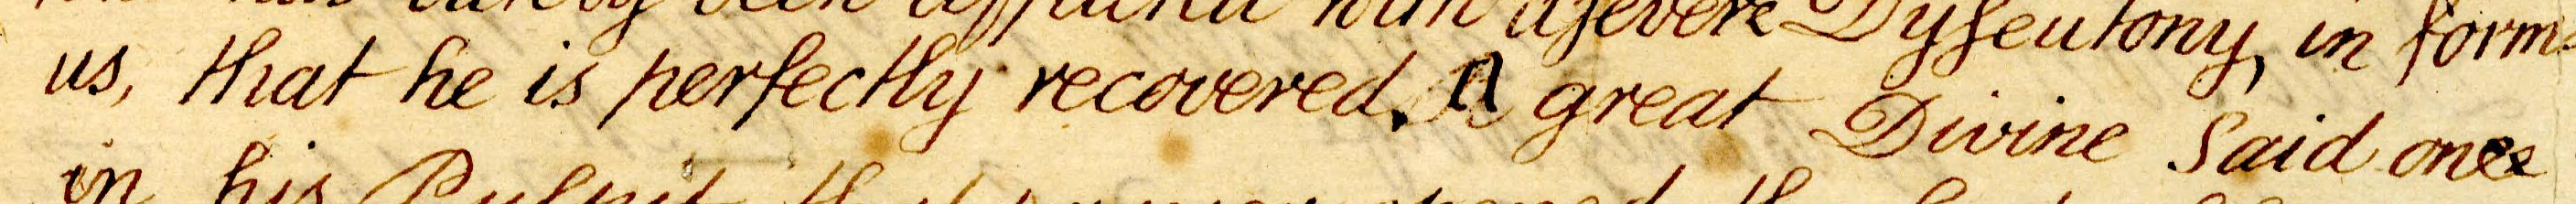us, that he is perfectly recovered A great Divine said one
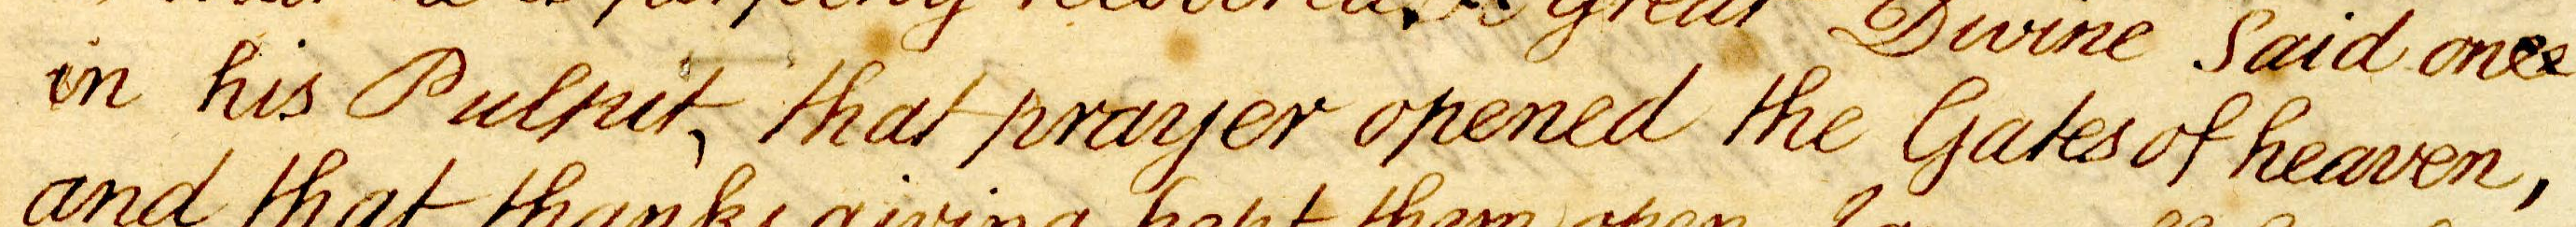in his Pulpit, that prayer opened the Gates of heaven,
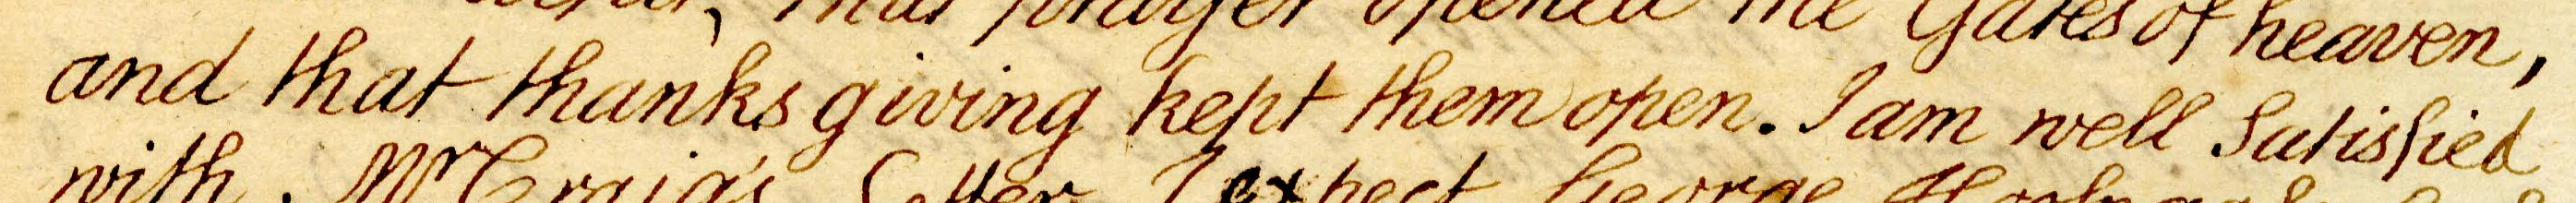and that thanks giving kept them open. I am well Satisfied
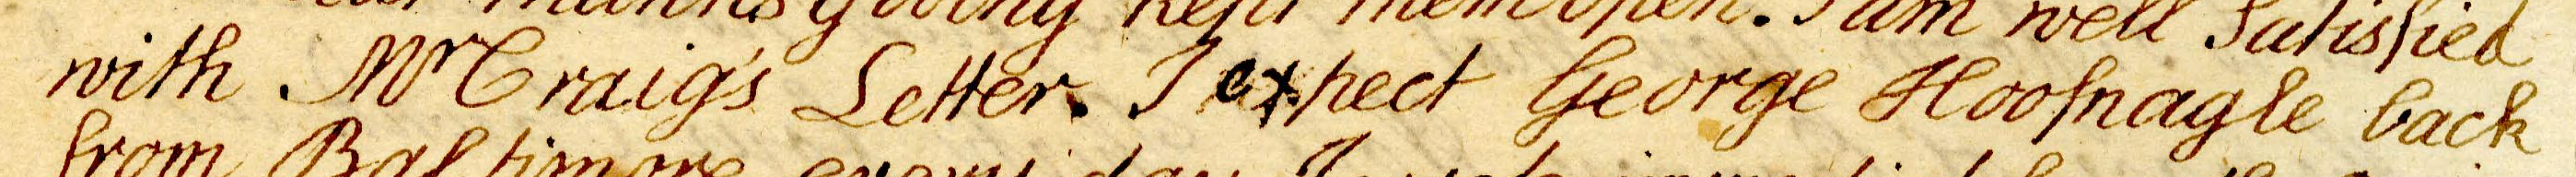with M^r Craig's Letter I expect George Hoofnagle back
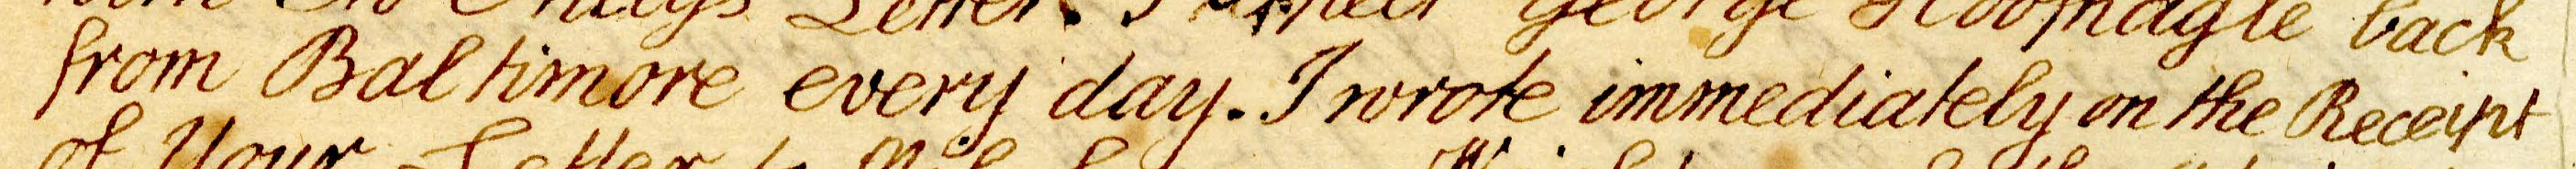from Baltimore every day. I wrote immediately on the Receipt
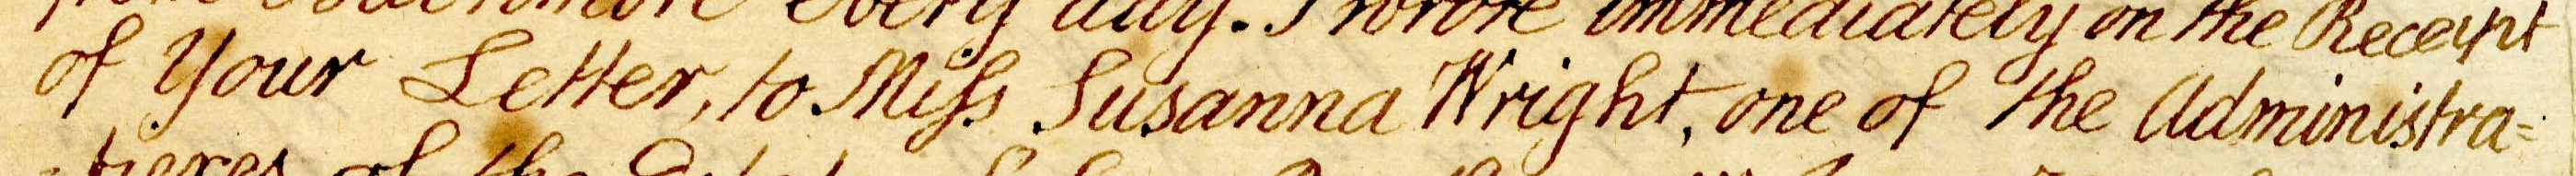of Your Letter, to Miss Susanna Wright, one of the Administra-
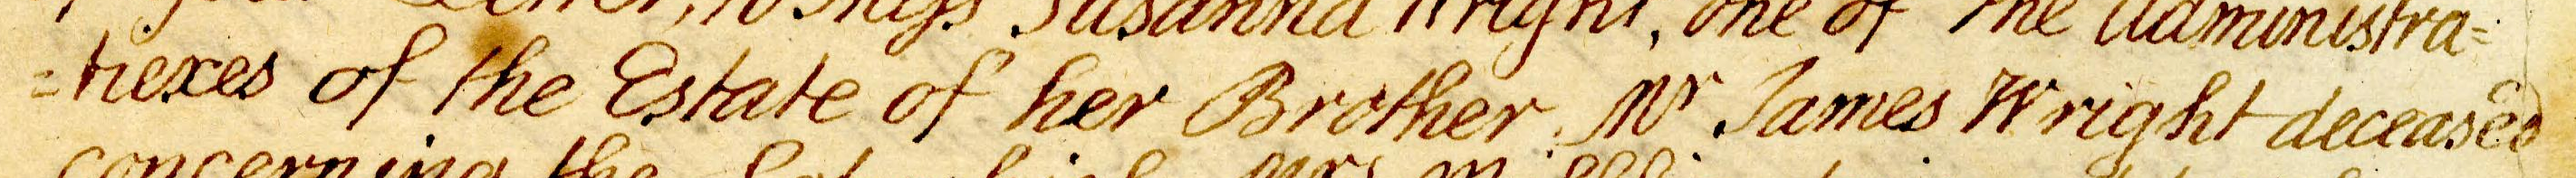-trixes of the Estate of her Brother, M^r James Wright deceased
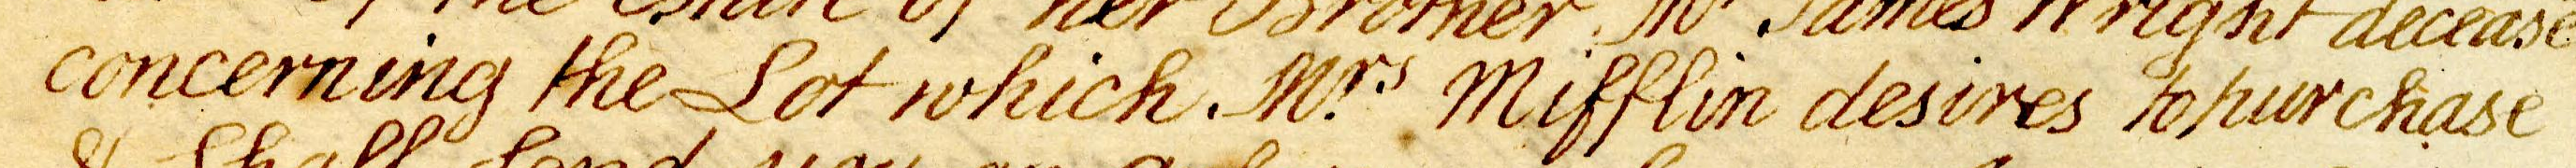concerning the Lot which M.^rs Mifflin desires to purchase
